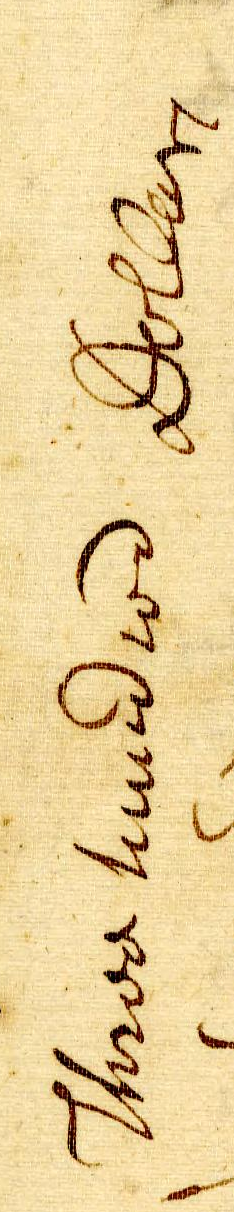Three hundred Dollars
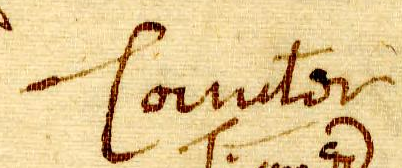Counter
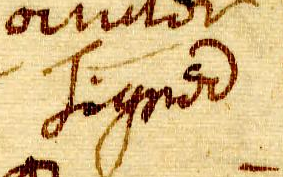Signed
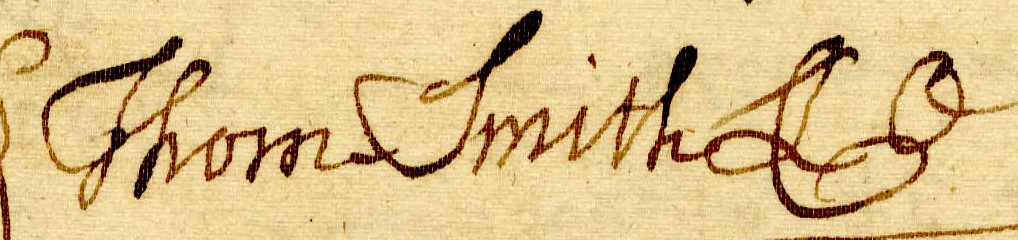Thom Smith CO
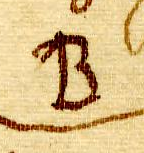B
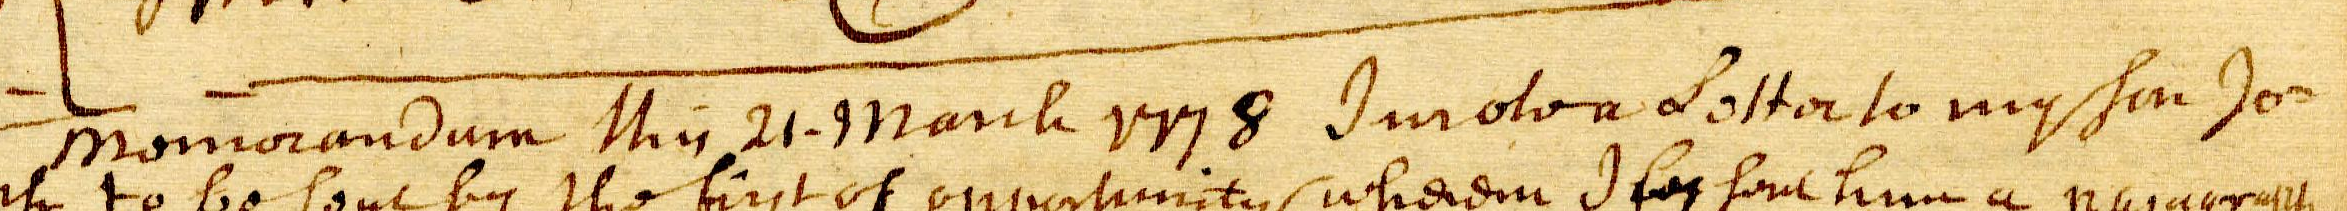Memorandum this 21 March 1778 I wrote a Letter to my son Jos
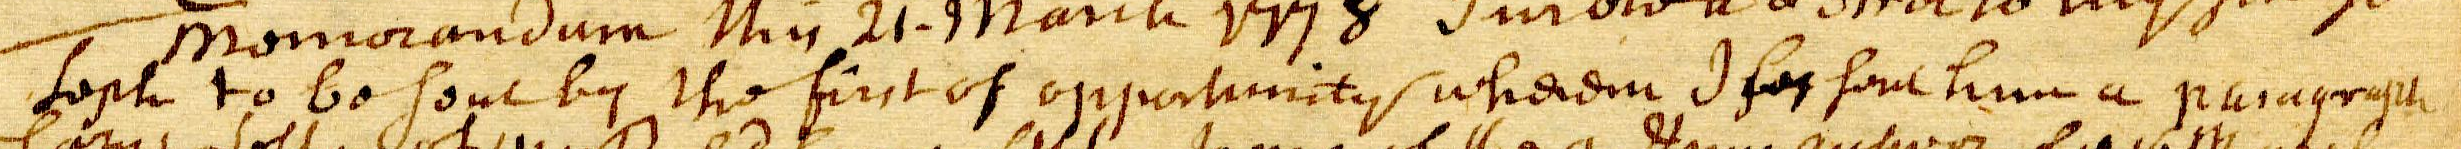seph to be sent by the first of opportunity wherem I [___] sent him a paragraph
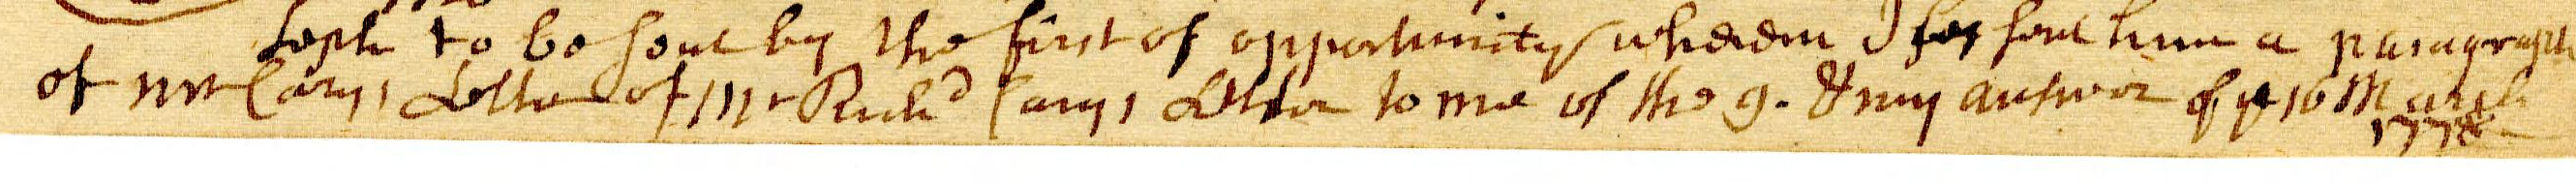of M^r Carys Letter of Mr Rich^d Carys Letter to me of the 9. per my answer of y^e 16 March
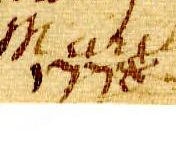1778
